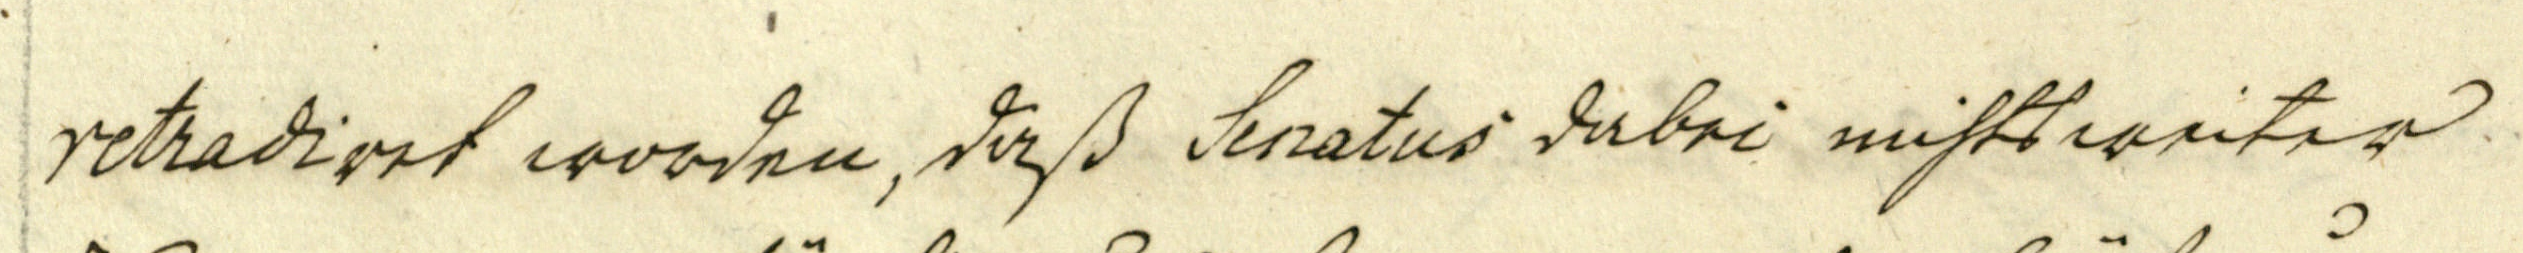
retradiret worden, daß Senatus dabei nichts weiter
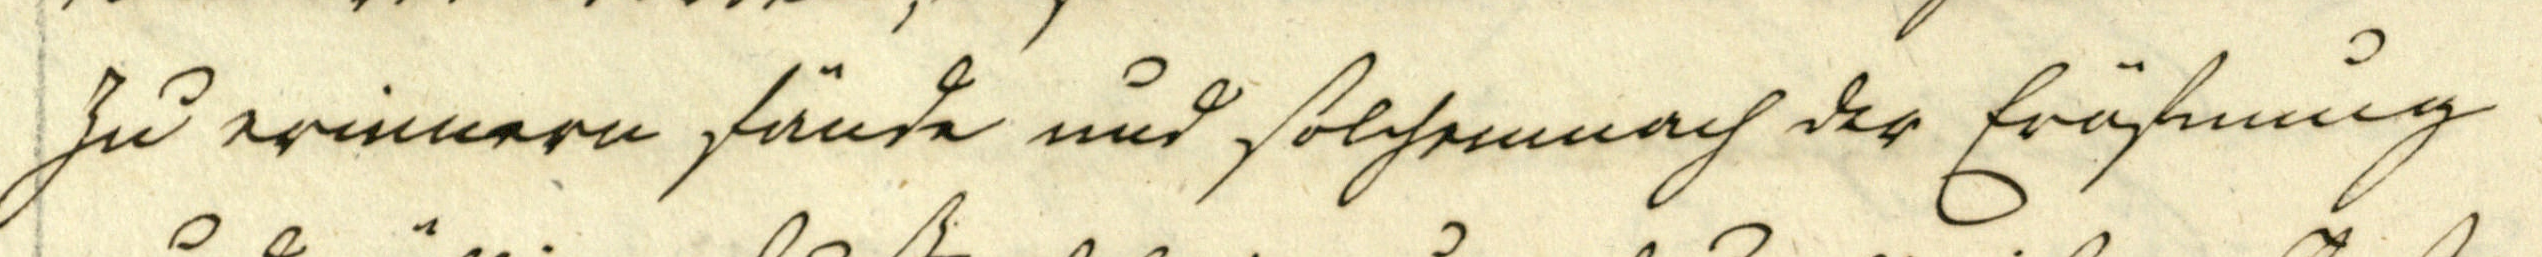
zu erinnern fände und solchemnach der Eröfnung
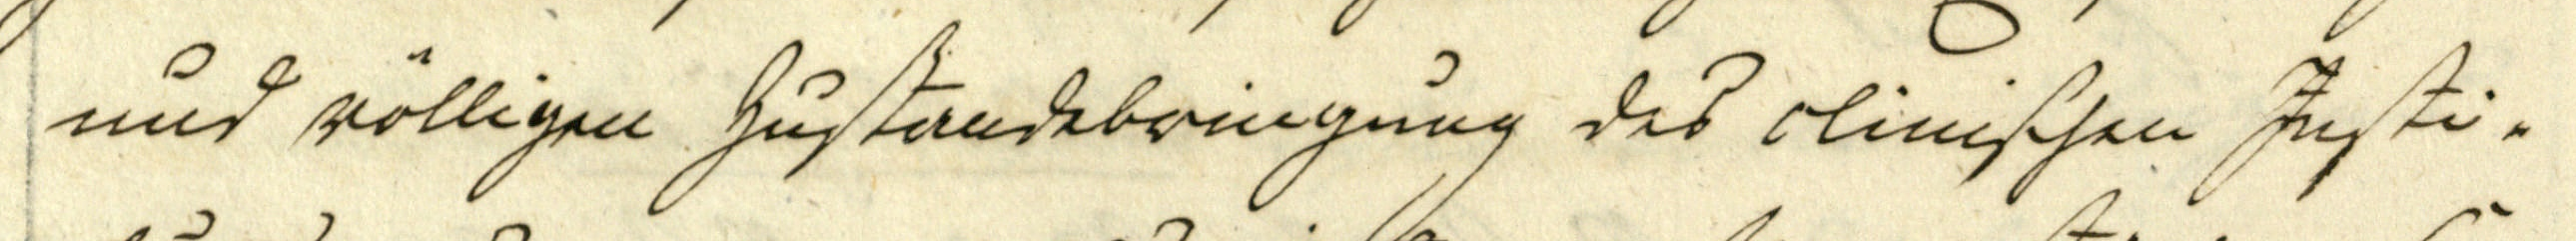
und völligen Zustandebringung des clinischen Insti¬
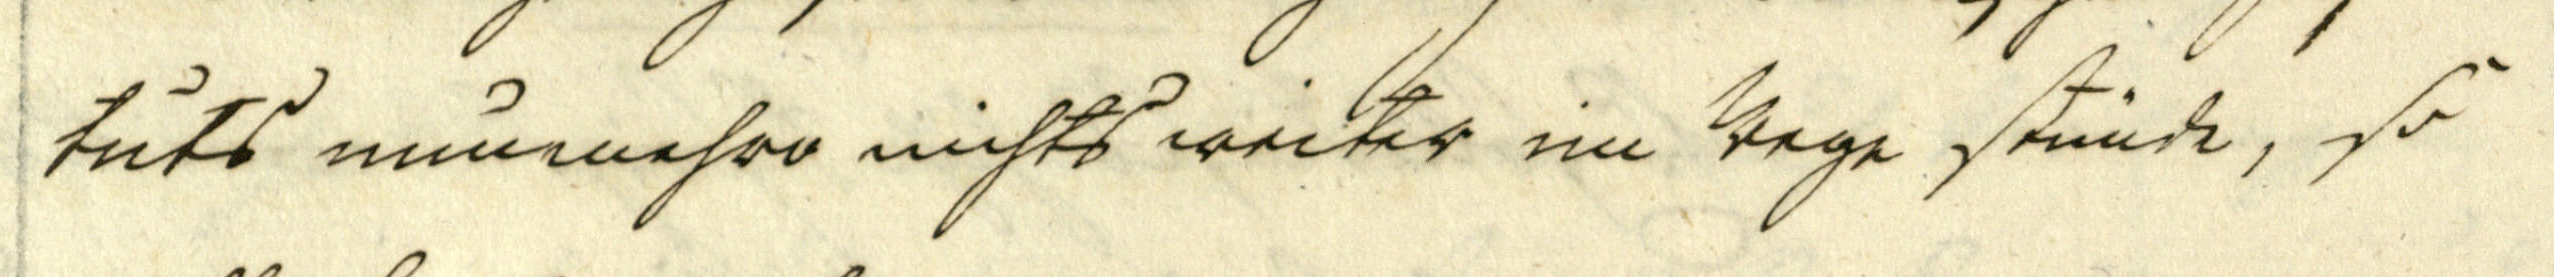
tuts nunmehro nichts weiter im Wege stünde, so
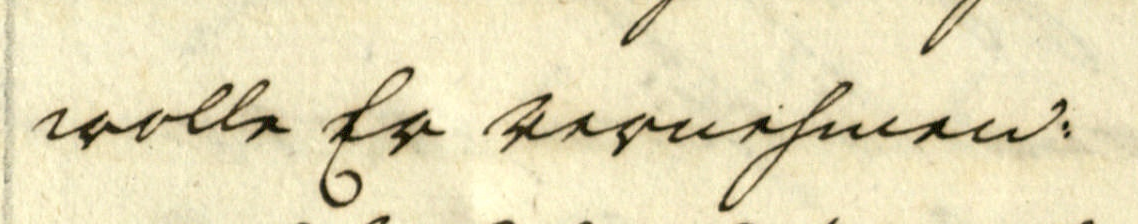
wolle Er vernehmen:
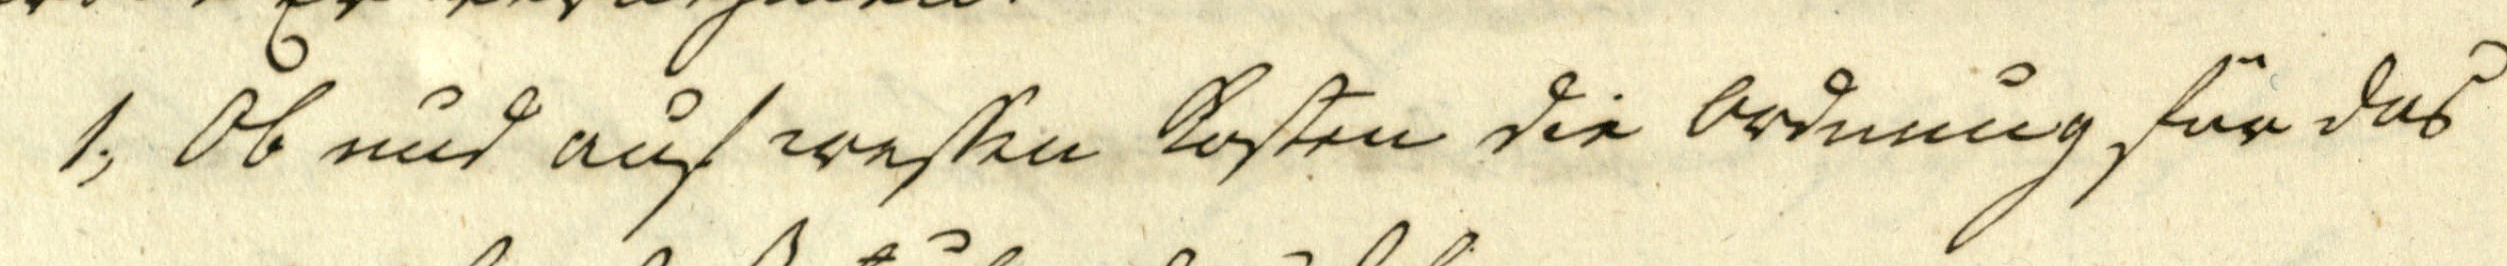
1., Ob und auf wessen Kosten die Ordnung für das
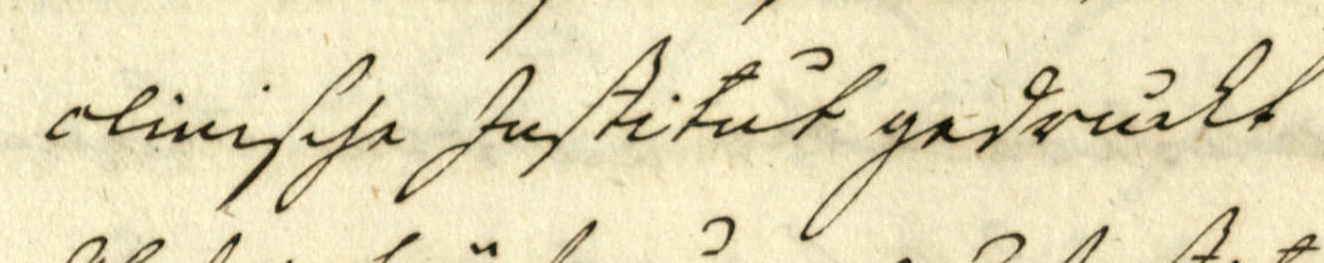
clinische Institut gedruckt
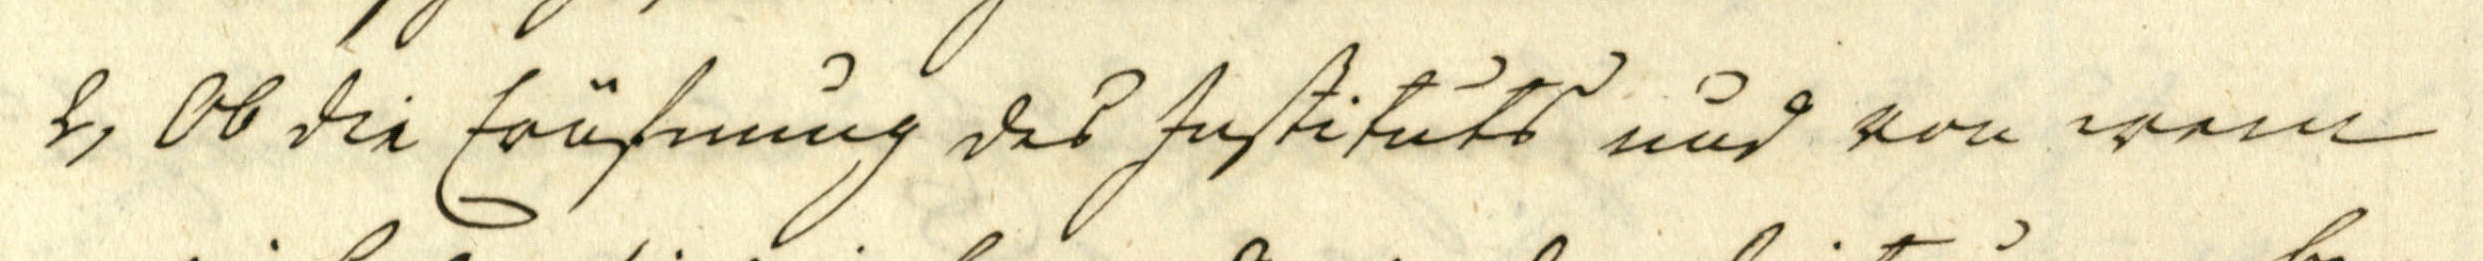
2, Ob die Eröfnung des Instituts und von wem
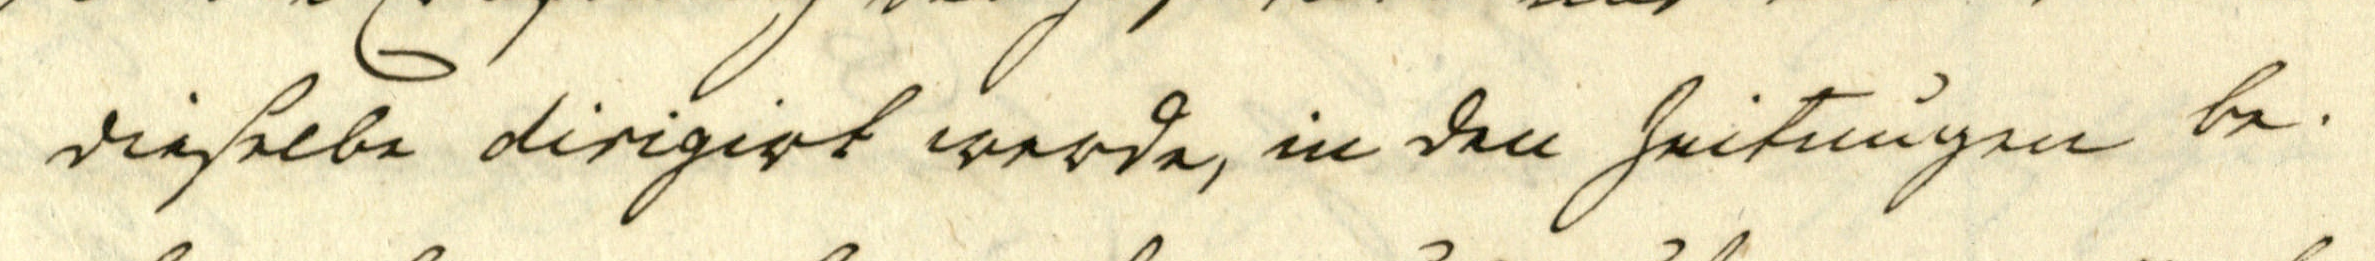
dieselbe dirigirt werde, in den Zeitungen be¬
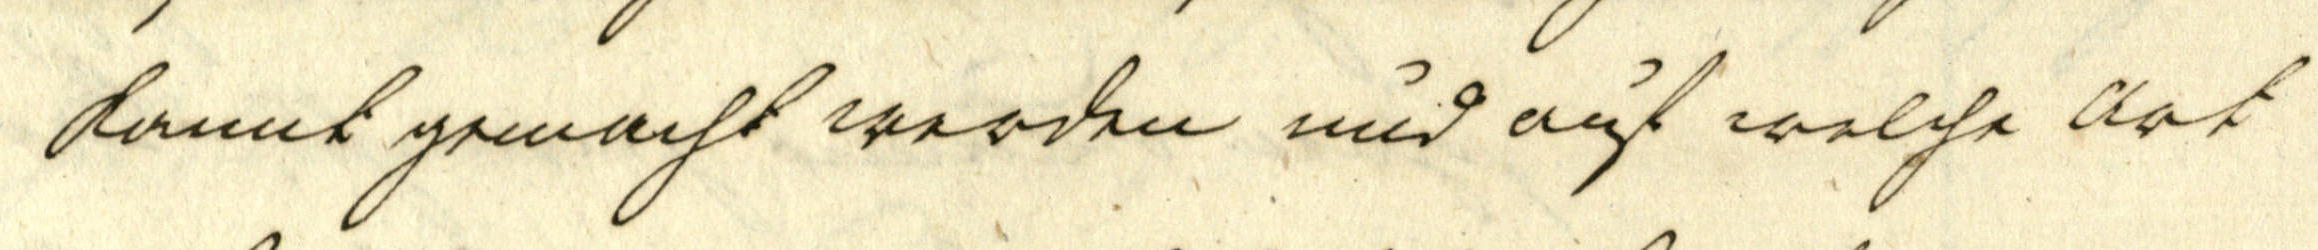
kannt gemacht werden und auf welche Art
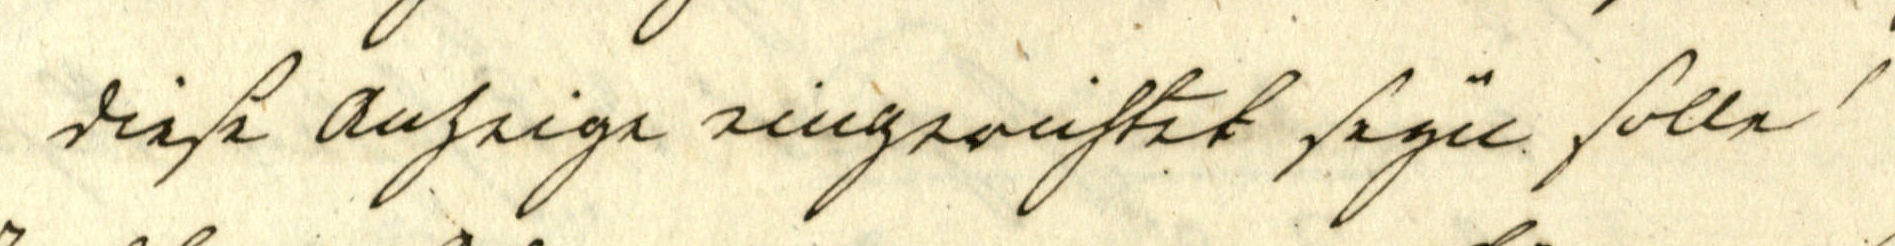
diese Anzeige eingerichtet seÿn solle?
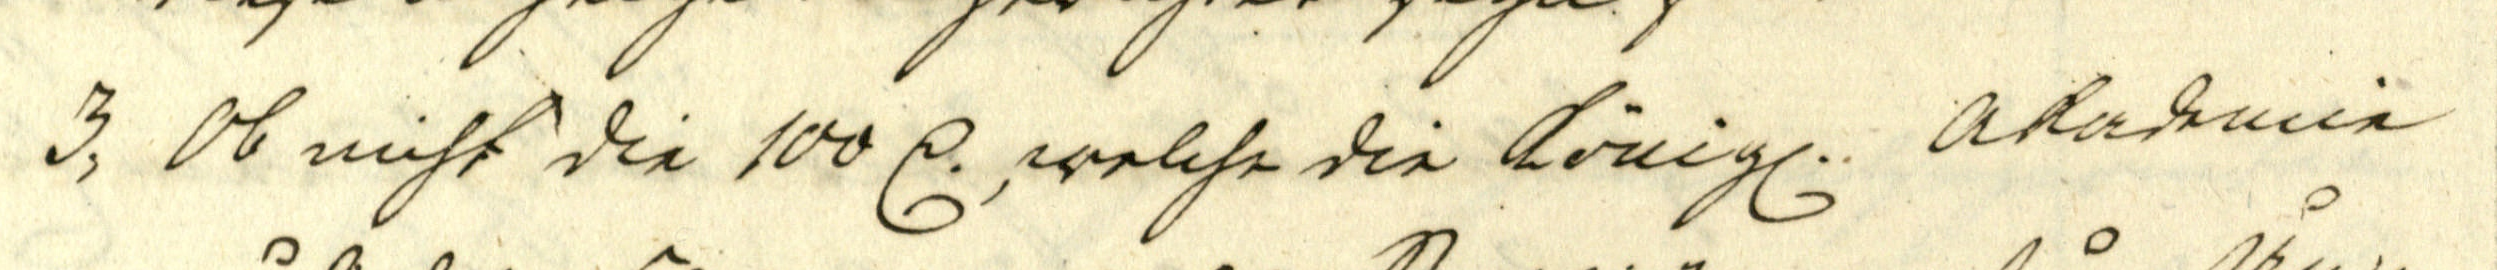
3. Ob nicht die 100 l. welche die Königl. Akademie
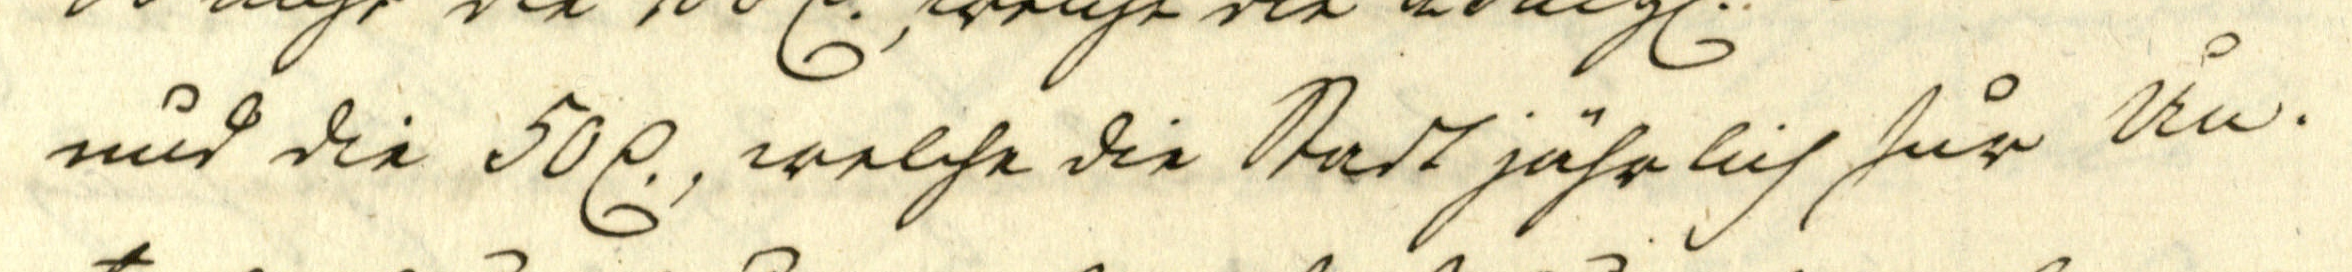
und die 50 l., welche die Stadt jährlich zur Un¬
